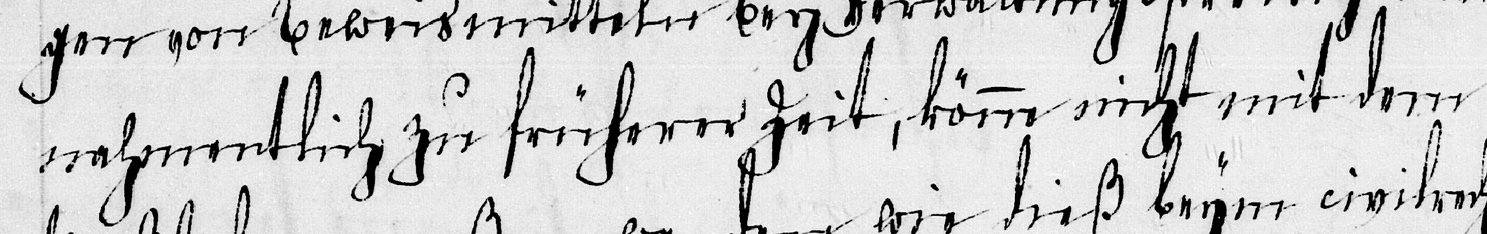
nahmentlich zu früherer Zeit, könne nicht mit dem
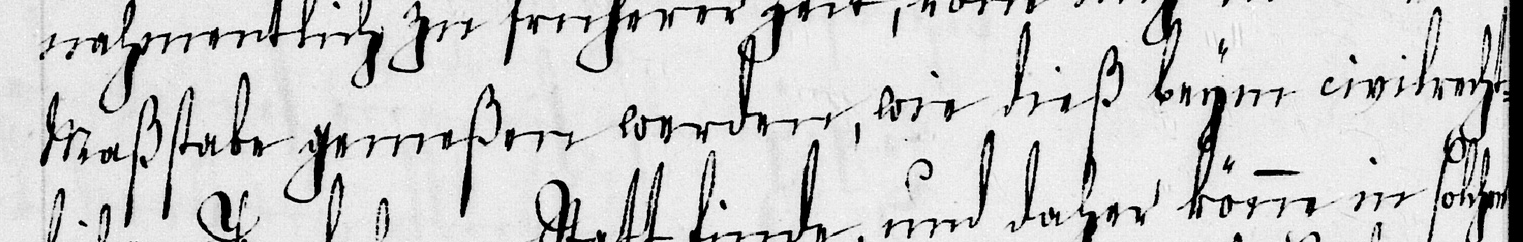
Maßstabe gemeßen werden, wie dieß beym civilrecht¬
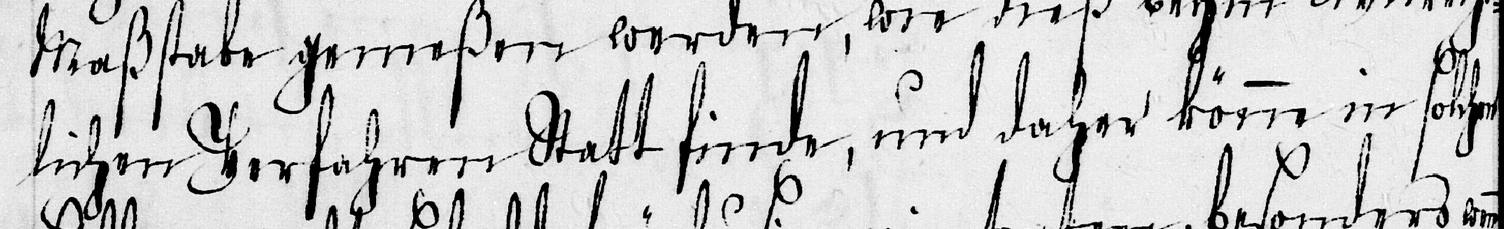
lichen Verfahren Statt finde, und daher könne in sol¬
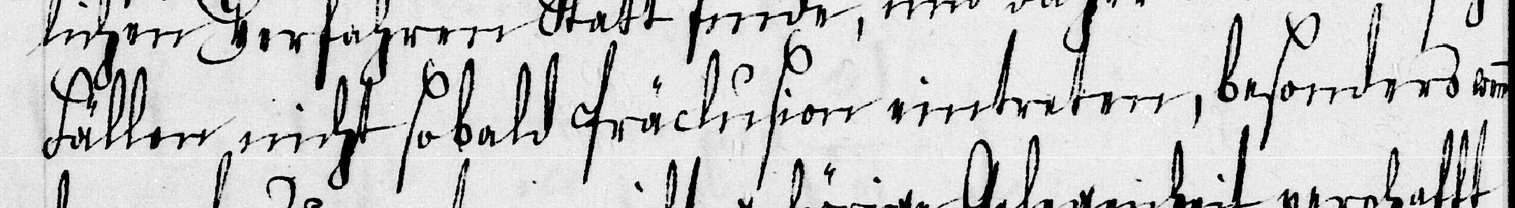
Fällen nicht sobald Präclusion eintreten, besonders
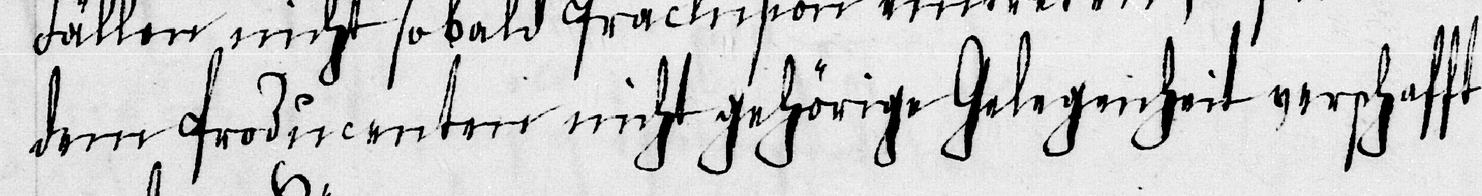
dem Producenten nicht gehörige Gelegenheit verschaf¬
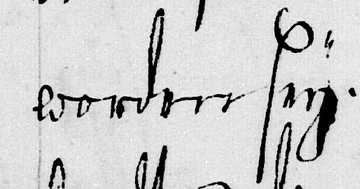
worden sey.
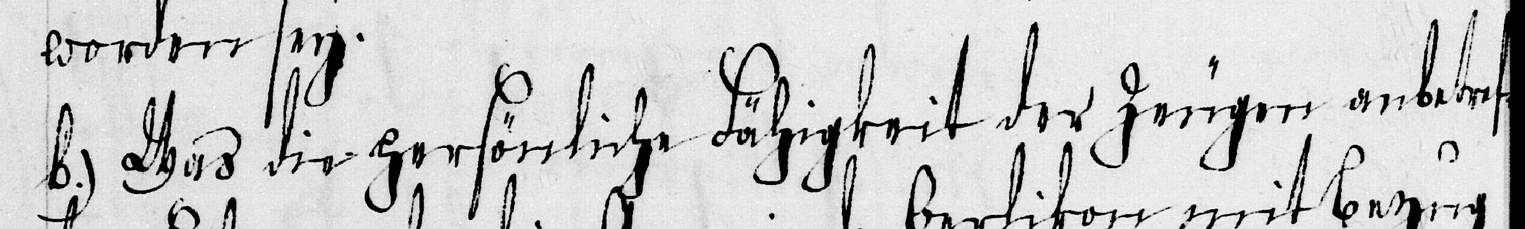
b.) Was die persönliche Fähigkeit der Zeugen anbetre¬
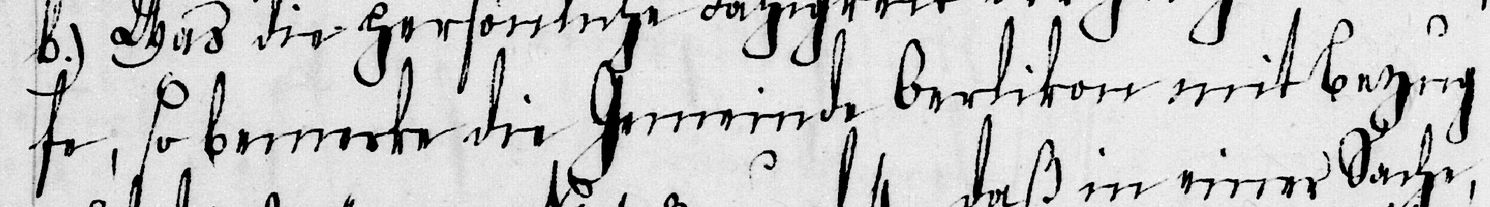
ffe, so bemerke die Gemeinde Oerlikon mit Bezug
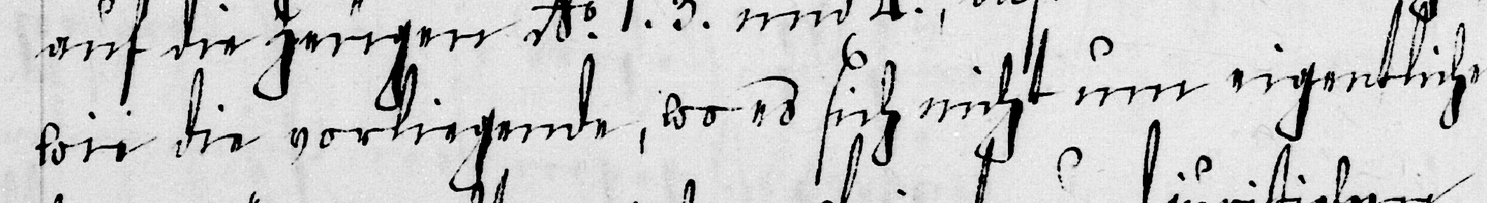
wie die vorliegende, wo es sich nicht um eigentliche
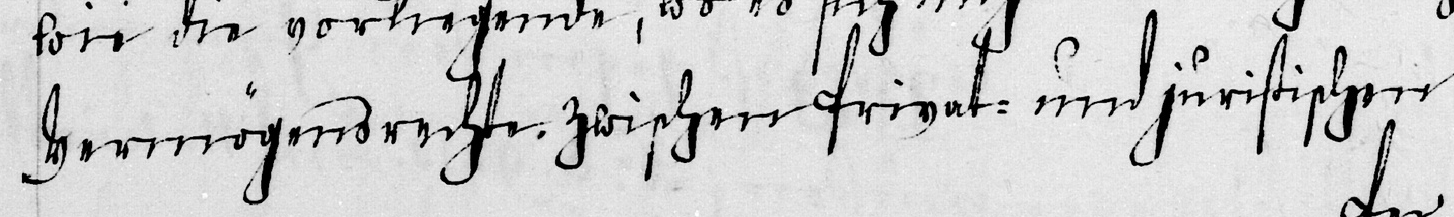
Vermögensrechte zwischen Privat- und juristischen
